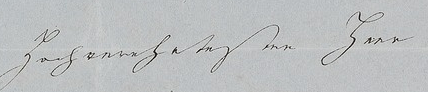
Hochverehrtester Herr!
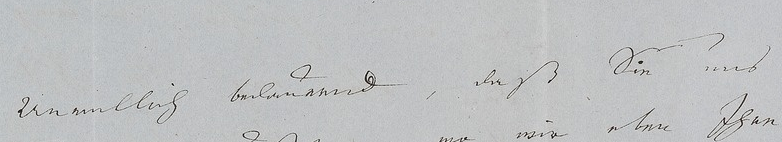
Unendlich bedauernd, daß Sie uns
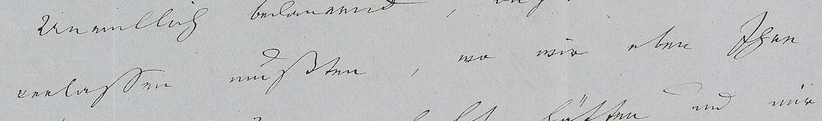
verlassen mußten, wo wir eben Ihre
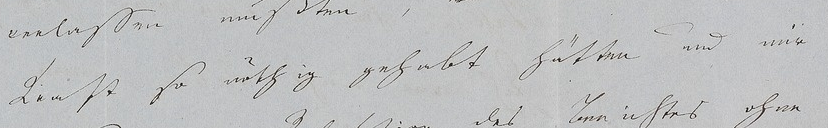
Kraft so nöthig gehabt hätten und mir
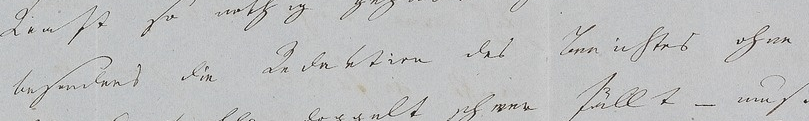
besonders die Redaktion des Berichtes ohne
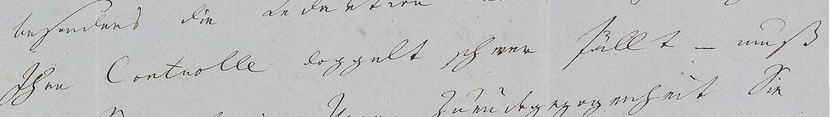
Ihre Controlle doppelt schwer fällt – muß
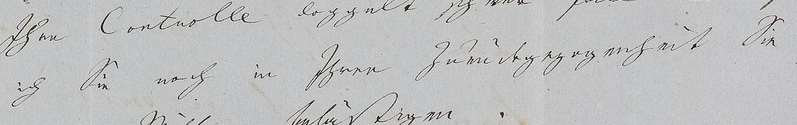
ich Sie noch in Ihrer Zurückgezogenheit Sie
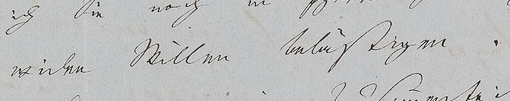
wider Willen belästigen.
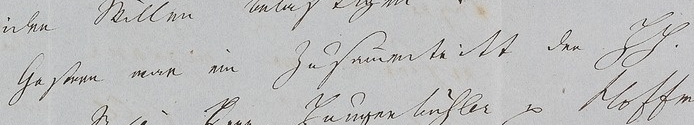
Gestern war ein Zusammentritt der HH.
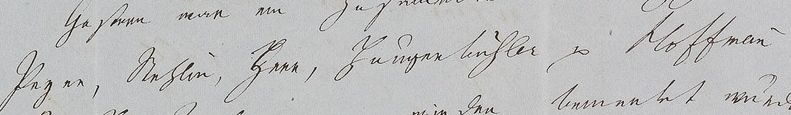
Peyer, Stehlin, Heer, Hungerbühler & Hoffmann
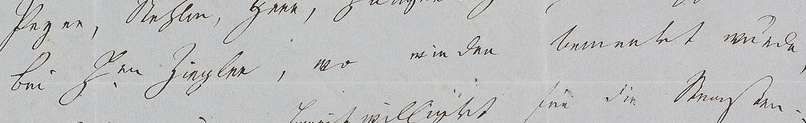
bei HrnZiegler, wo wieder bemerkt wurde,
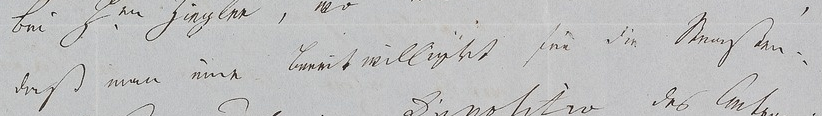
daß man eine Bereitwilligkeit für die Straßen-
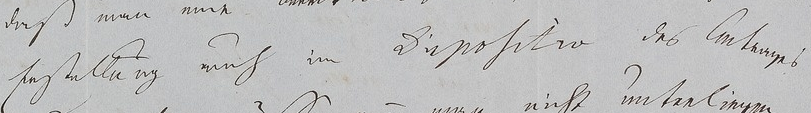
Erstellung auch im Dispositiv des Antrages
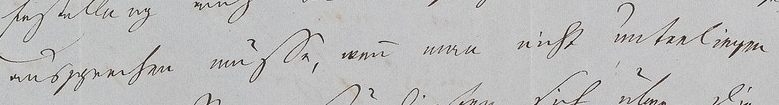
aussprechen müsse, wenn man nicht unterliegen
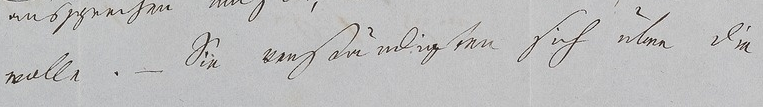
wolle. – Sie verständigten sich über die
